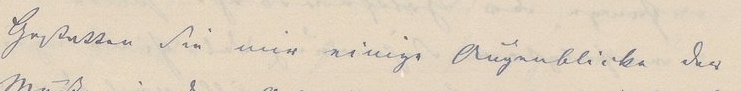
Gestatten Sie mir einige Augenblicke der
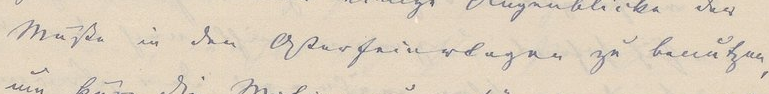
Muße in den Osterfeiertagen zu benutzen,
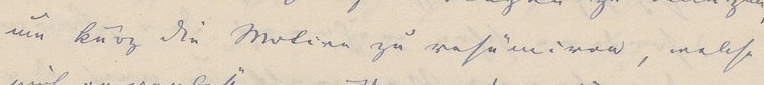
um kurz die Motive zu resümiren, welche
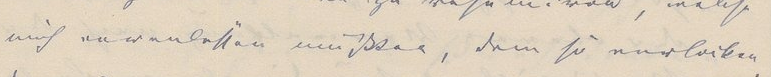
mich veranlassen mußten, dem so verlocken-
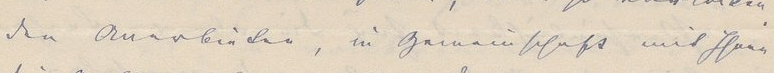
den Anerbieten, in Gemeinschaft mit Ihnen
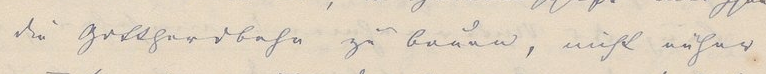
die Gotthardbahn zu bauen, nicht näher
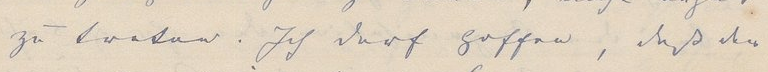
zu treten. Ich darf hoffen, daß der
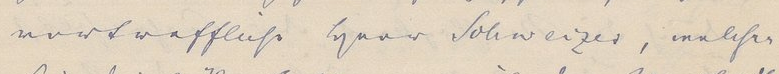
vortreffliche Herr Schweizer, welchen
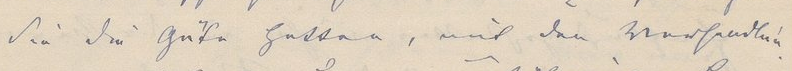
Sie die Güte hatten, mit den Verhandlun-
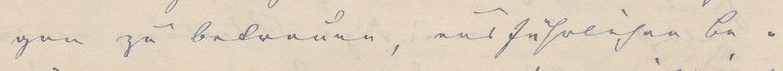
gen zu betrauen, ausführlichen Be-
